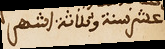عشر سنة وثلاثة اشهر
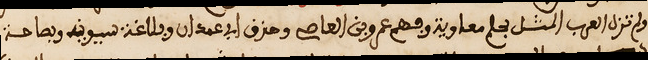ولم نزل العرب المثل بحلم معاوية وفهم عمرو بن العاص وصذق ابى عمدان وبلاغة سيونيه وبصاحة
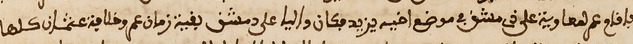فاقام عمر لمعاوية على ذى مشق في موضع اخيه يزيد فكان واليا على دمشق بقية زمان عمر وخلافة عثمان كلها
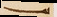قف
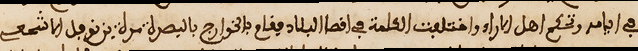في ايامه وتحكم اهل الاراء واختلفت الكلمة في اقصا البلاد فقام بالخوارج بالبصرة مرة بن نوفل الاشحعى
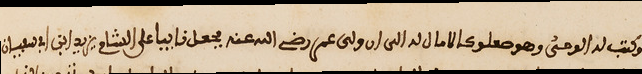كتب له الوحى وهو صعلوك لا مال له الى ان ولى عمر رضى الله عنه فجعل نايبا على الشام يزيد ابن ابى سفيان
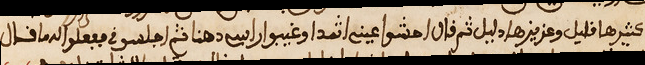كثيرها قليل وعزيزها دليل ثم قال احشوا عينى اثمدا وعيبوا راسى دهنا ثم اجلسونى ففعلوا له ما قال
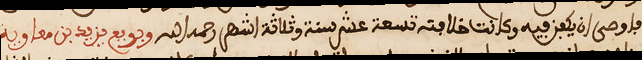فاوصى ان يكفن فيه وكانت خلافته تسعة عشر سنة وثلاثة اشهر رحمه الله وبويع يزيد بن معاوية
